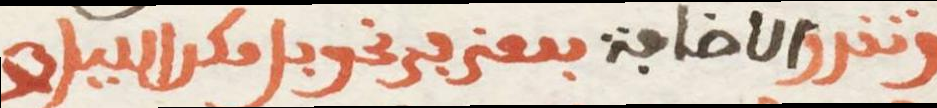وتقدر الاضافة بمعنى في نحو بل مكر الليل و
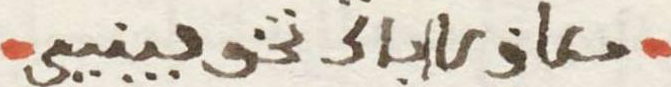مكان لا اباك تحق فيبنيي
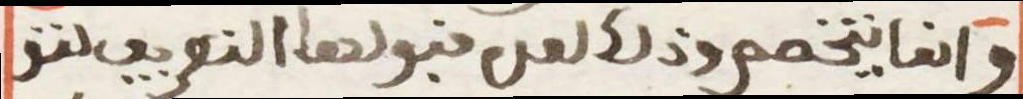وانما يتخصص وذلك لعدم قبولها التعريف لتو
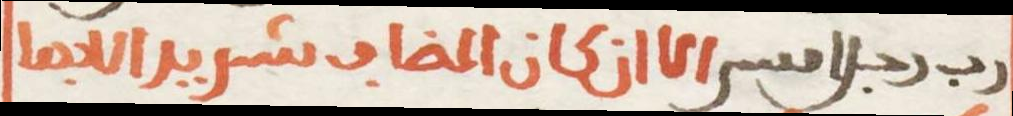رب رجل امس الا ان كان المضاف شديد الابها
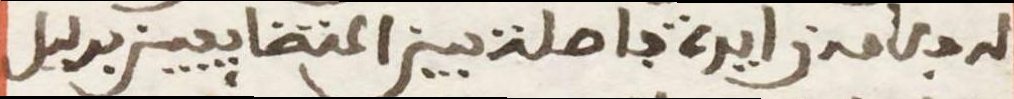له بلامه زايدة فاصلة بين المتضايعيين بدليل
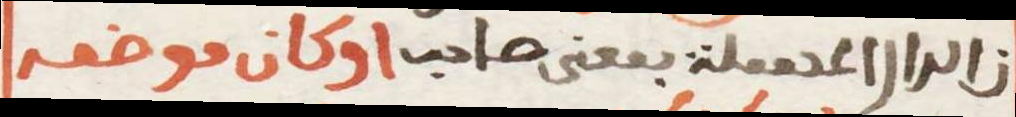ن الدال المهملة بمعنى صاحب او كان موضعه
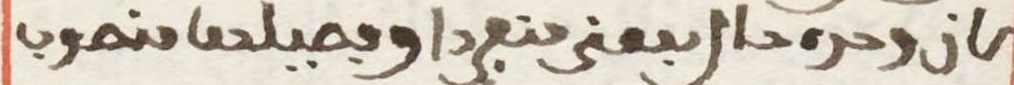كان وحده حال بمعنى منفردا وفصيلها منصوب
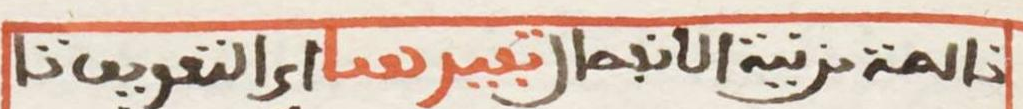خالصة من نية الانفصال تفيرهما أي التعريف تا
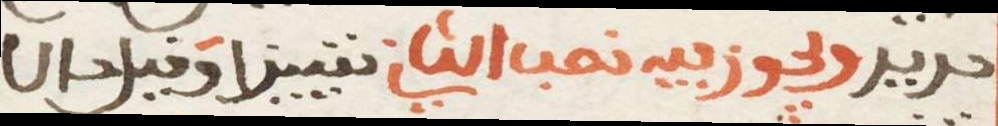حديد ويجوز فيه نصب الثاني تمييزا وقيل حالا
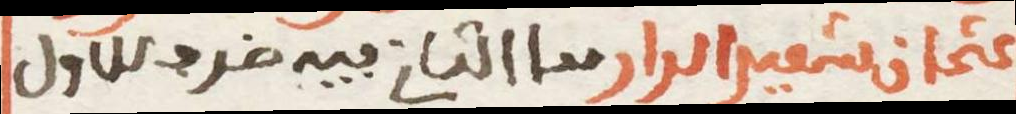عثمان شعير الواو معا الثاني فيه ضرب للأول
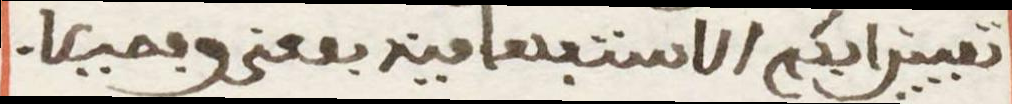تمييزا بكم الاستفهامية بمعنى وفصيلا
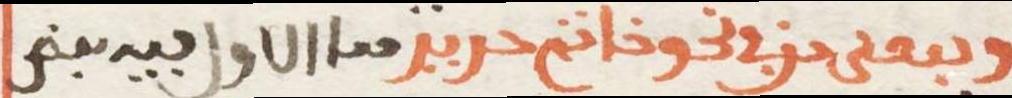وبمعنى دن في نحو خاتم حديد معا الاول فيه بعض
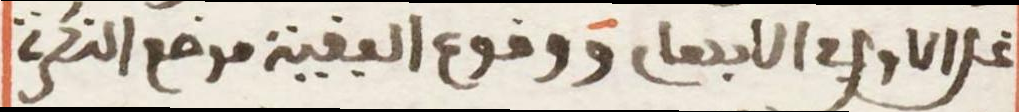غل الاول في الابهام ووقوع البقية موضع النكرة
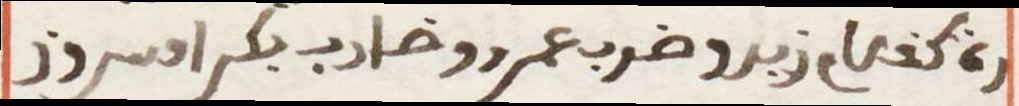رة كغلام زيد ضرب عمرو وضارب بكر امس وز
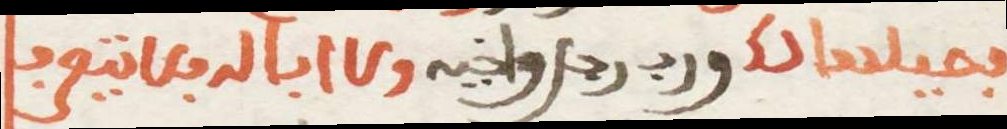فصيلها لك ورب رجل واخيه ولا أبا له فلا يتعرف
